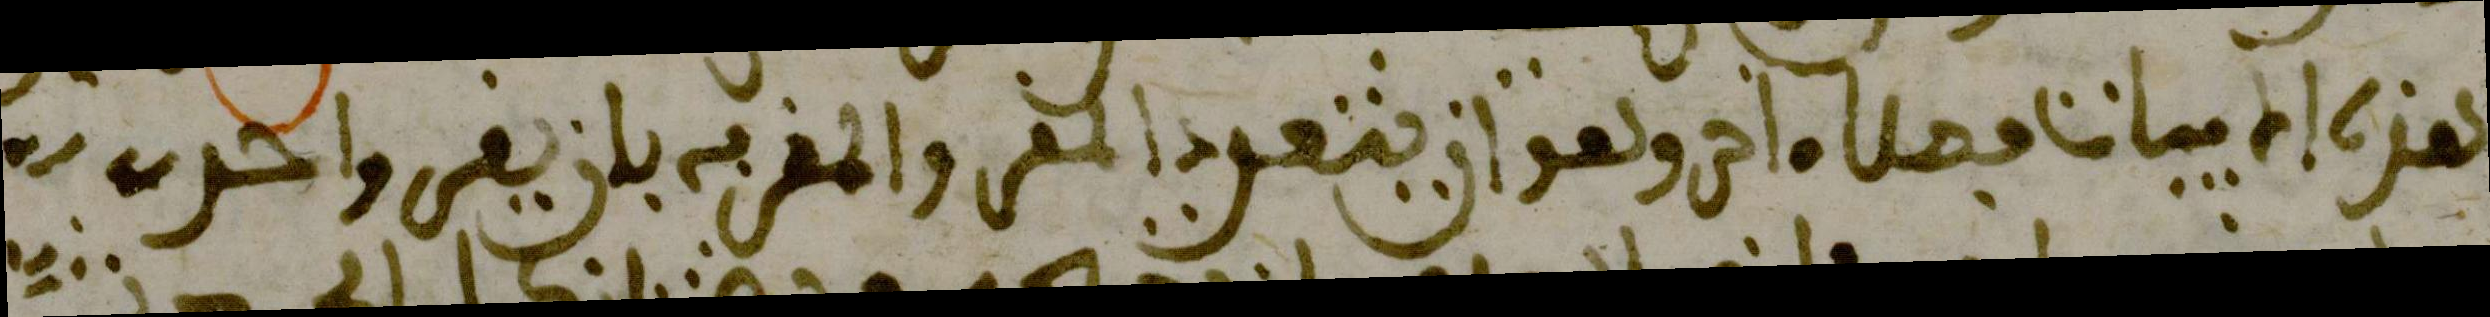هذه الابيات فصلا ءاخر وهو ان يتعدد المقر والمقر به بان يقر واحد
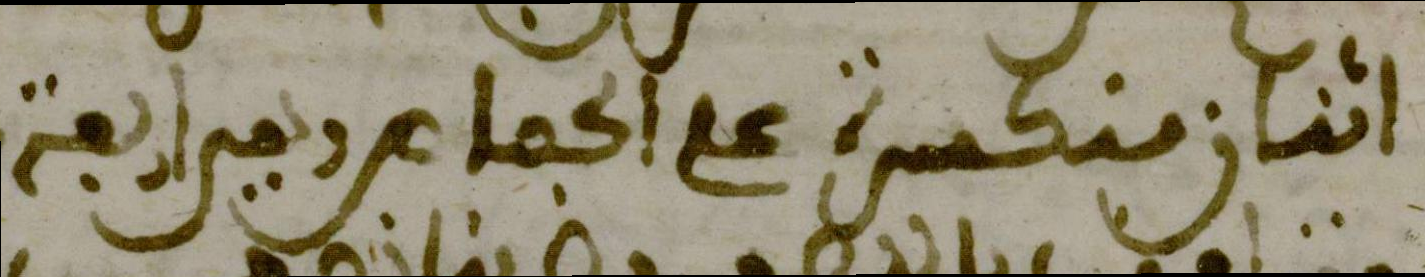اثنان منكسرة على الحصاص ووهي اربعة
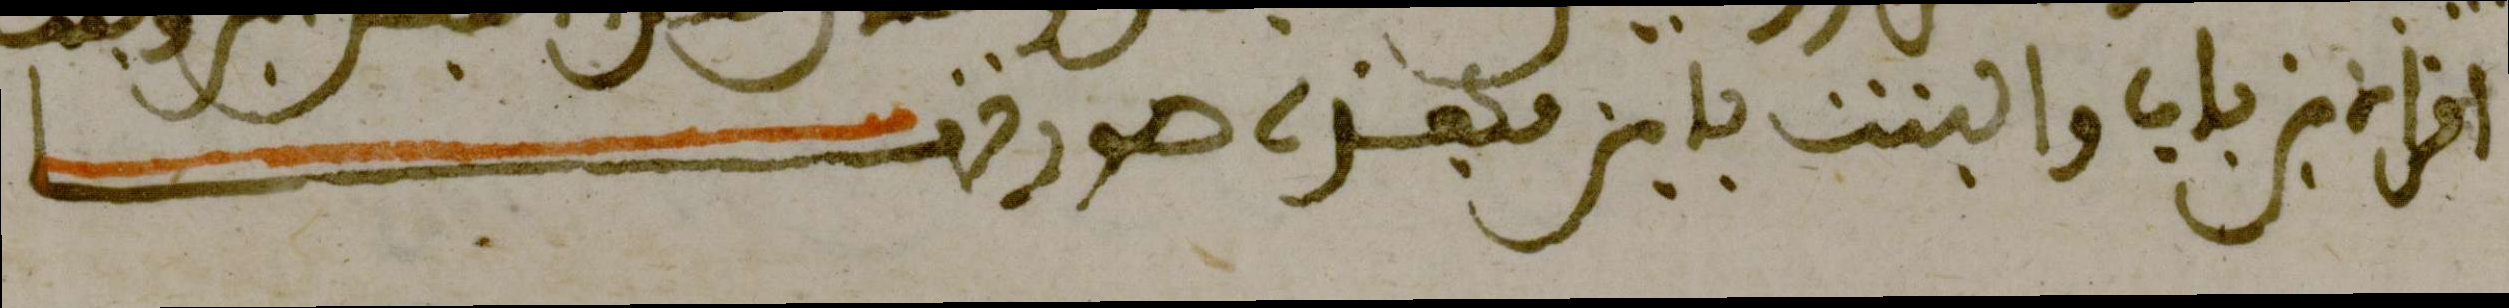اقرا لابن باب والبنت بابن فهذه صورتها
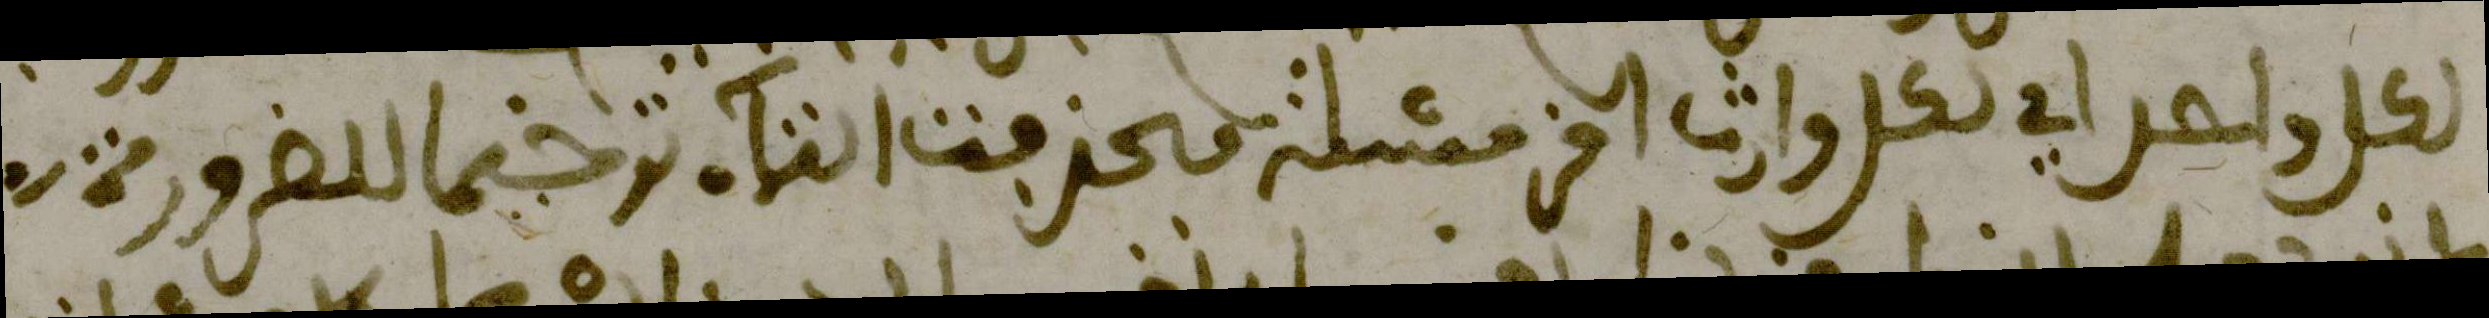لكل واحد اي لكل وارث اقر مسْلة فحذفت التاء ترخميا للضرورة
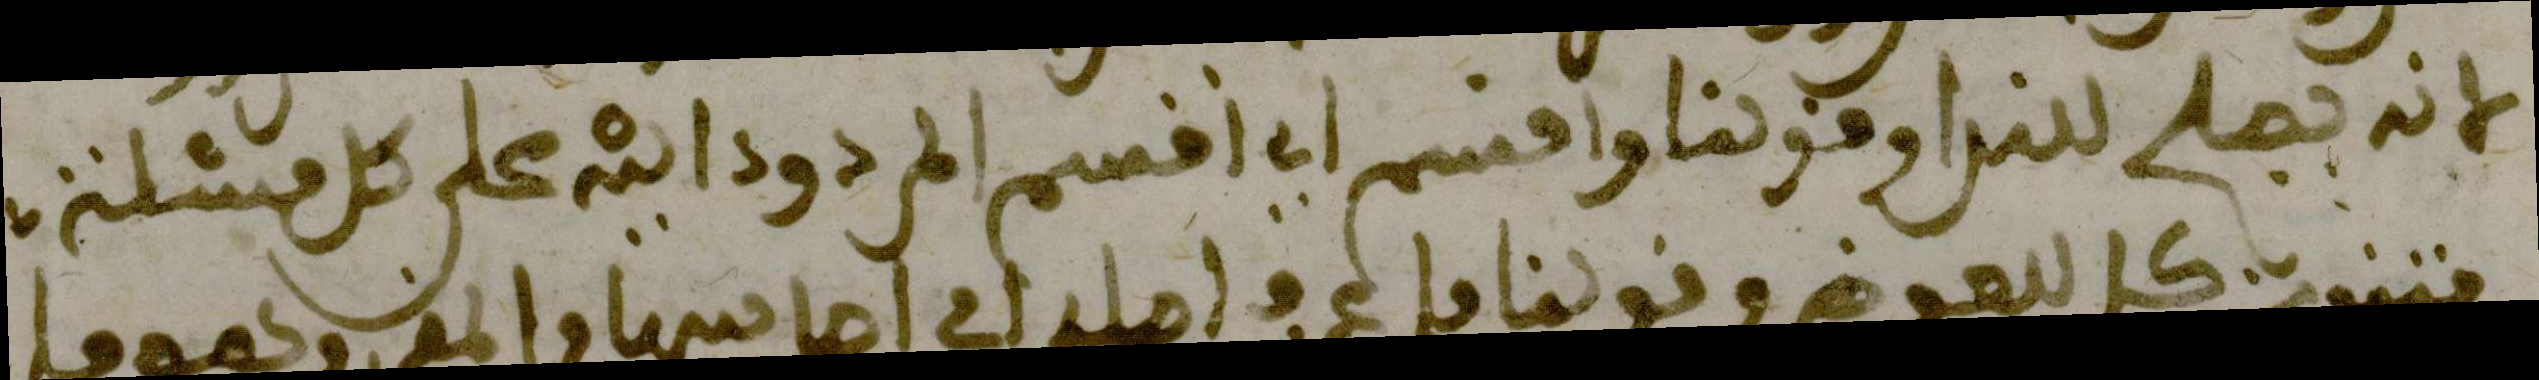لانه يصلح للندا وقولنا واقسم اي اقسم المردود اليْه على كل مسْلة
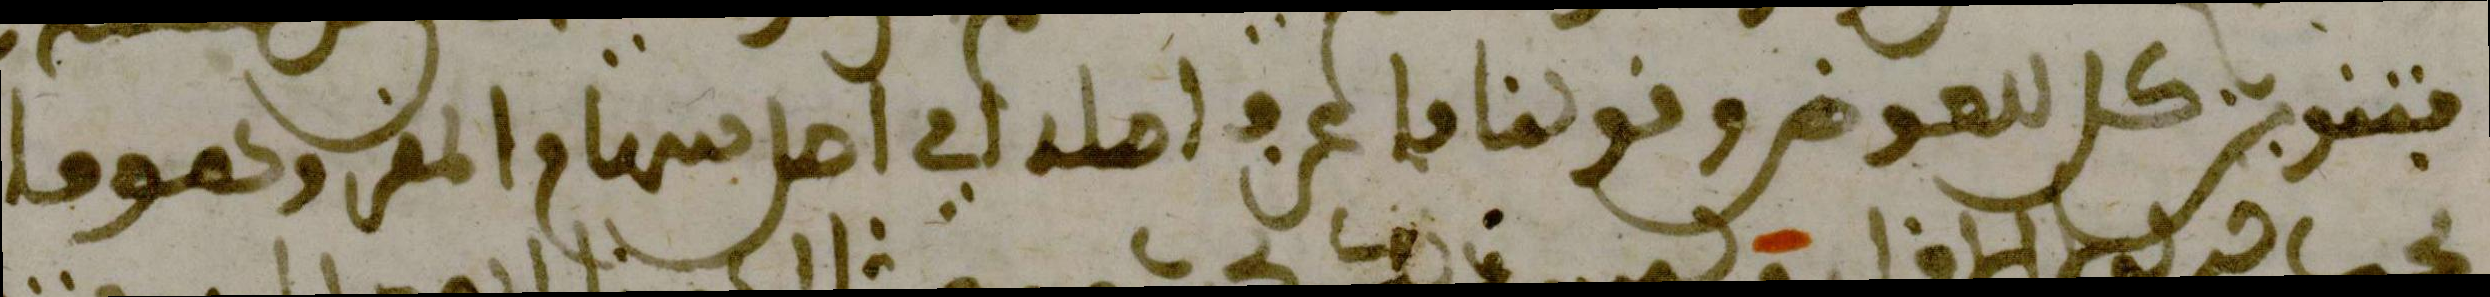فتنوين كل للعرض وقولنا فاعرف اصله اي اصل سهام المقرر وهو ما
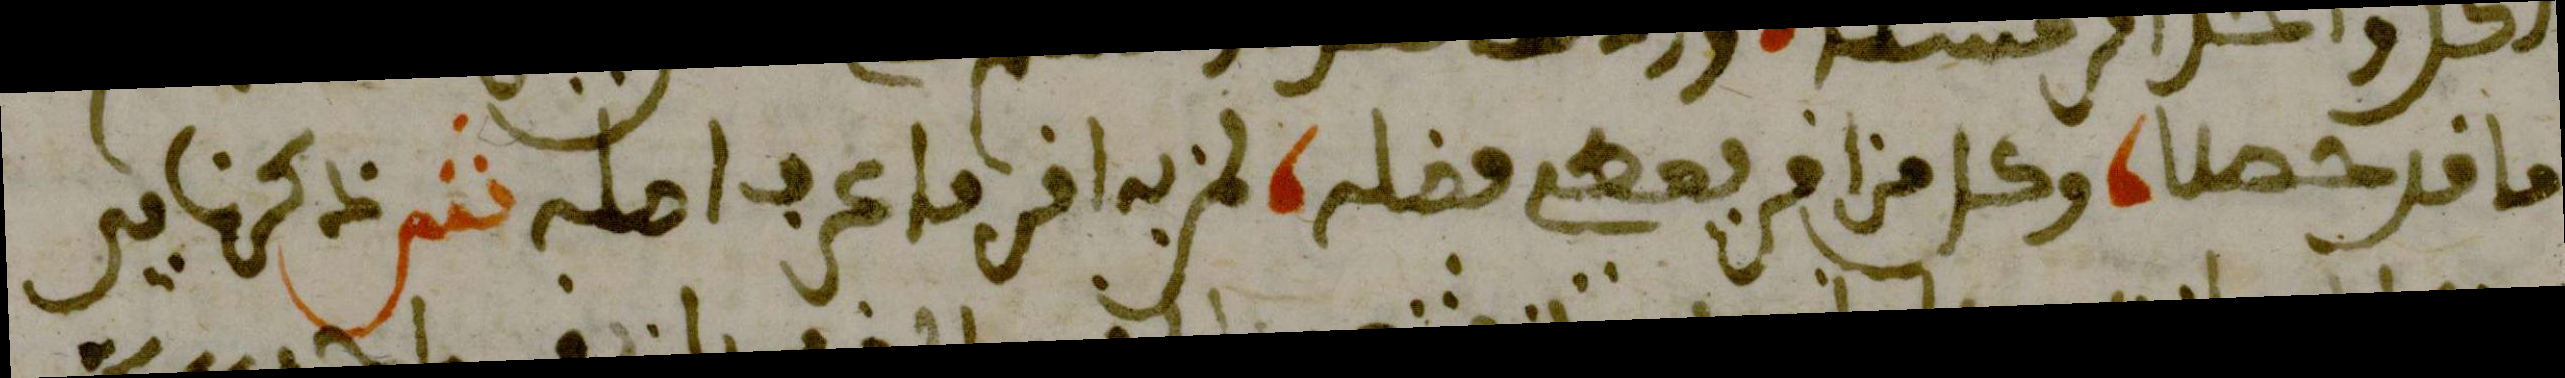ما قد حصلا ولك من اقر يعطي فضله لمن له اقرر فاعرف اصله ش ذكرن في
